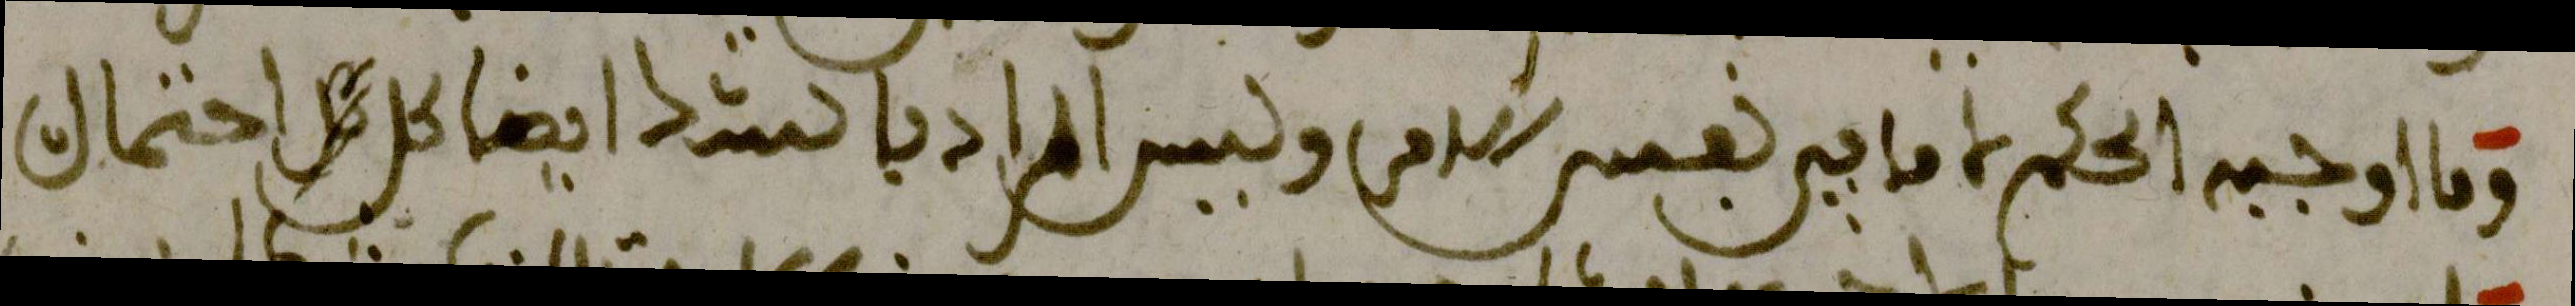وما اوجبه الحكم لا ما في نفس الامر وليس المراد بالشد ايضا كل احتمال
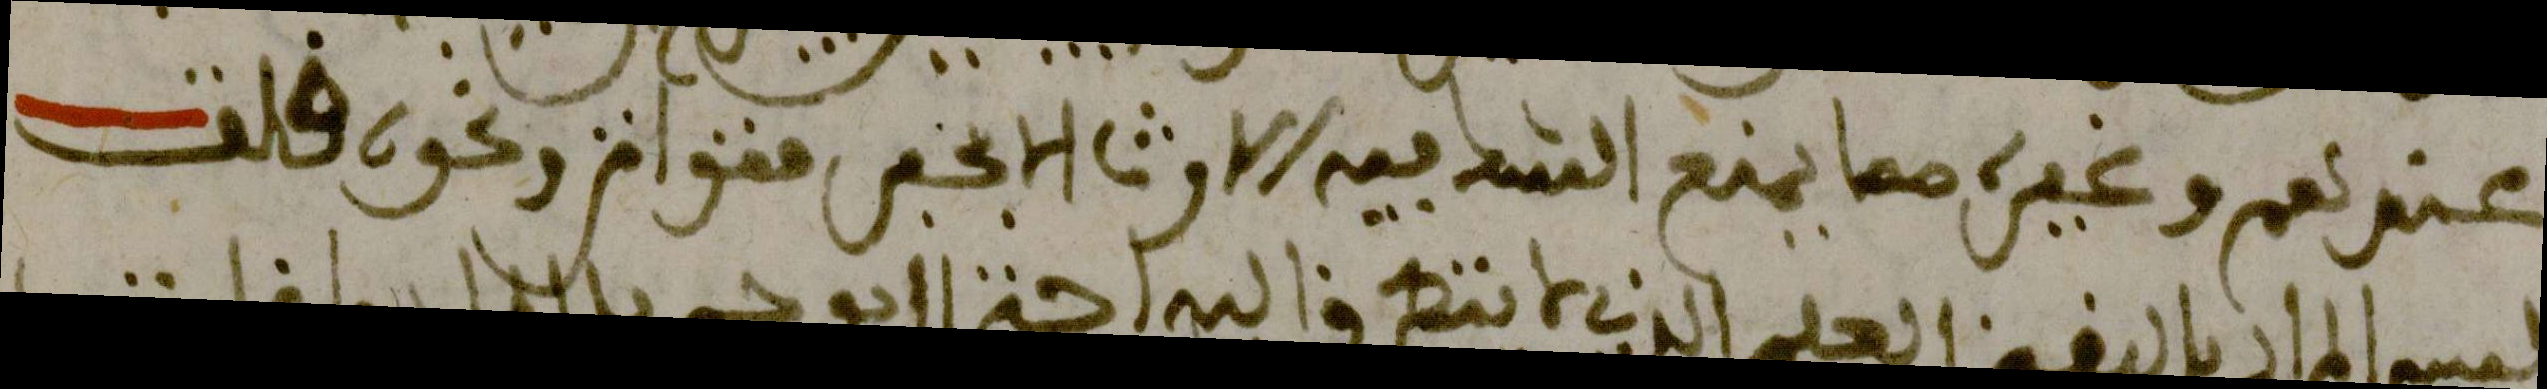عندهم وغيره مما يمنع الشد فيه الارث الا بخبر متواتر ونحوه قلت
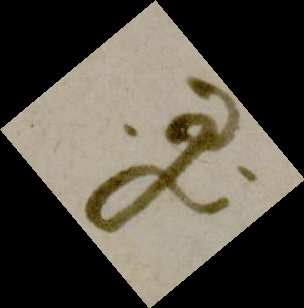بعض
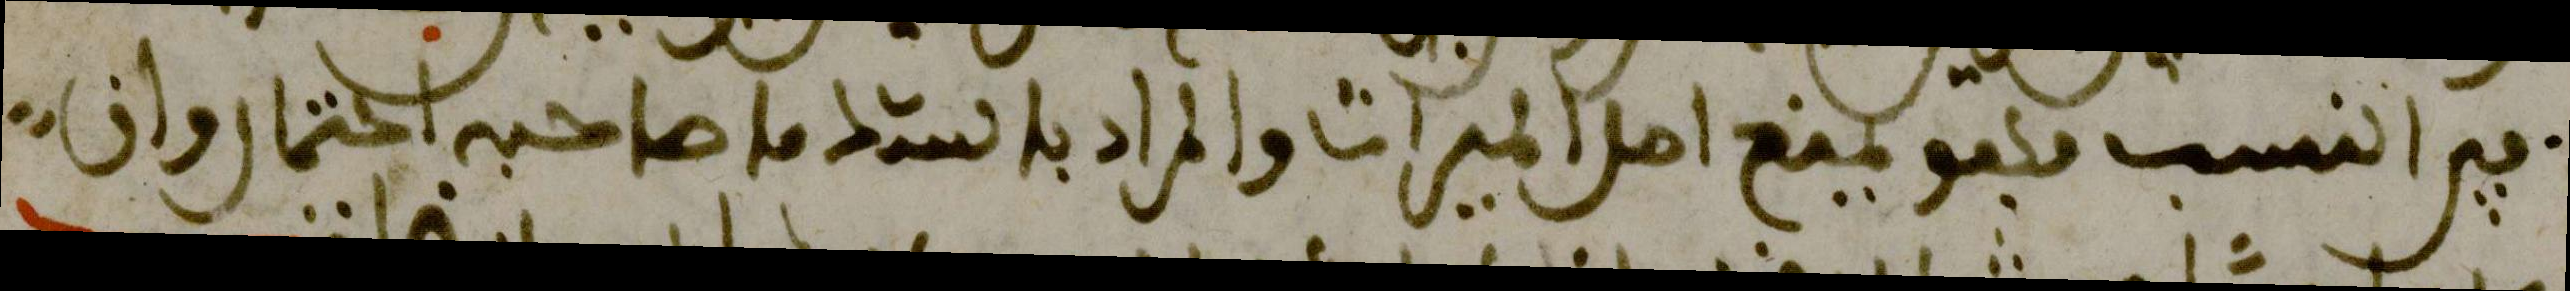في النسب فهو يمنع اصل الميراث والمراد بالشد ما صاحبه احتمال وان
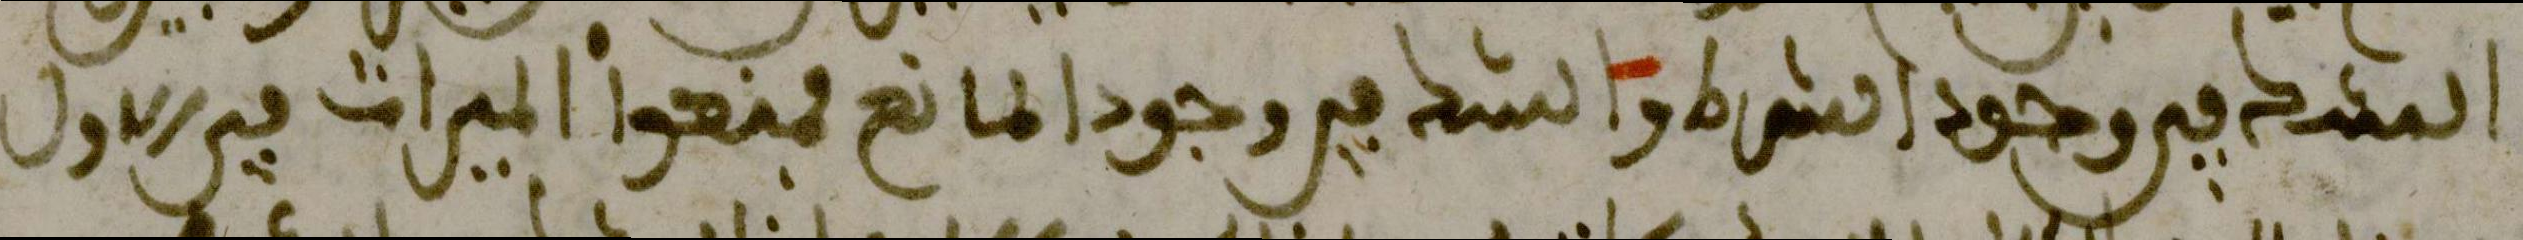الشد في وجود الشرط والشد في وجود المانع فمنعوأ الميراث في الاول
